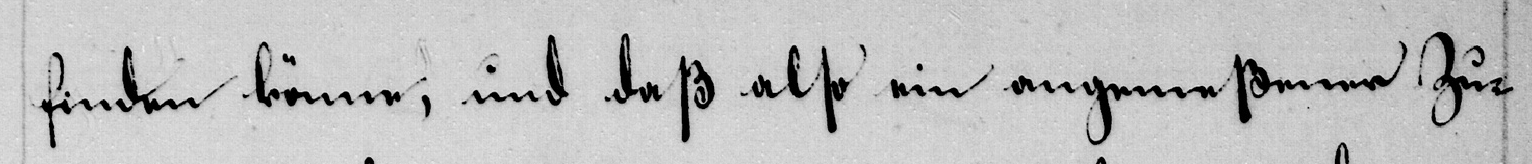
finden könne, und daß also ein angemeßener Zu¬
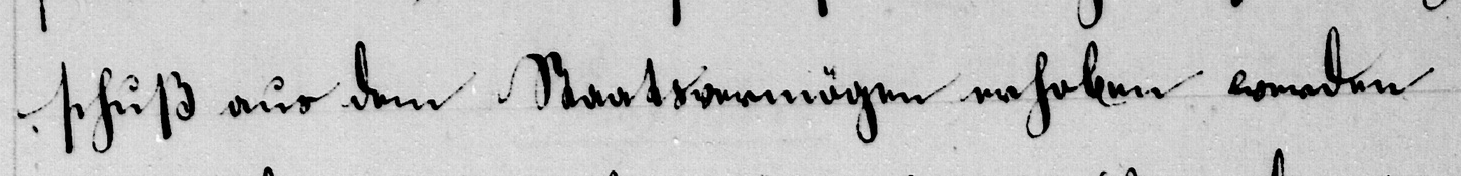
schuß aus dem Staatsvermögen erhoben werden
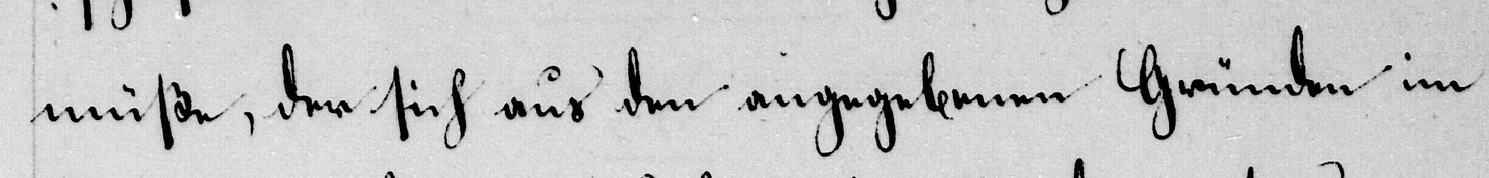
müße, der sich aus den angegebenen Gründen im
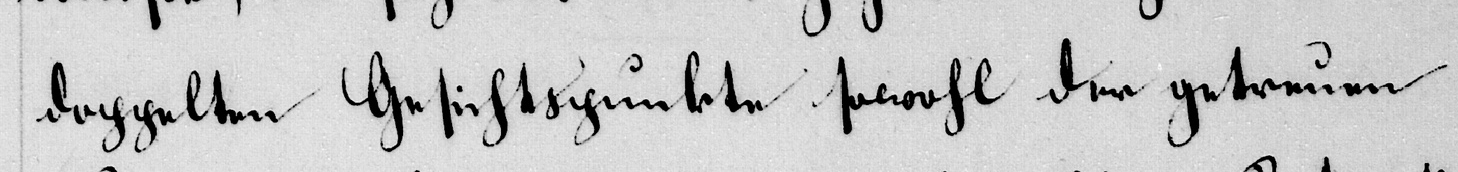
doppelten Gesichtspunkte sowohl der getreuen
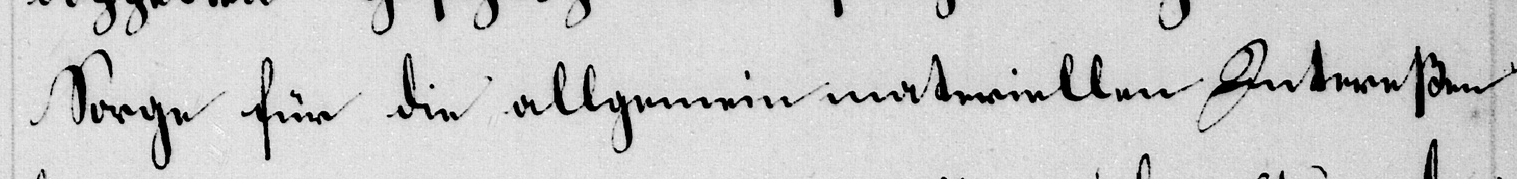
Sorge für die allgemein materiellen Intereßen
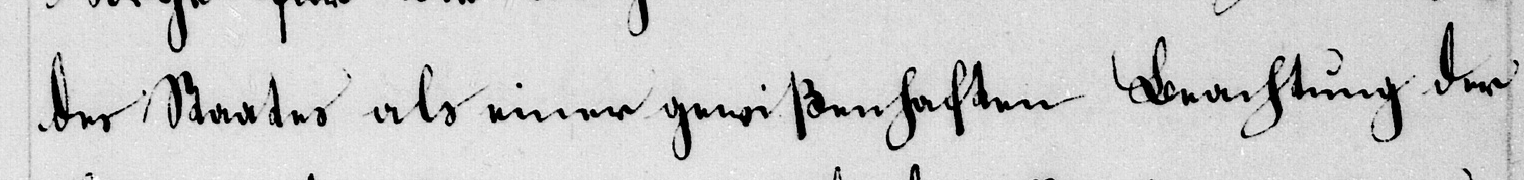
des Staates als einer gewißenhaften Beachtung der
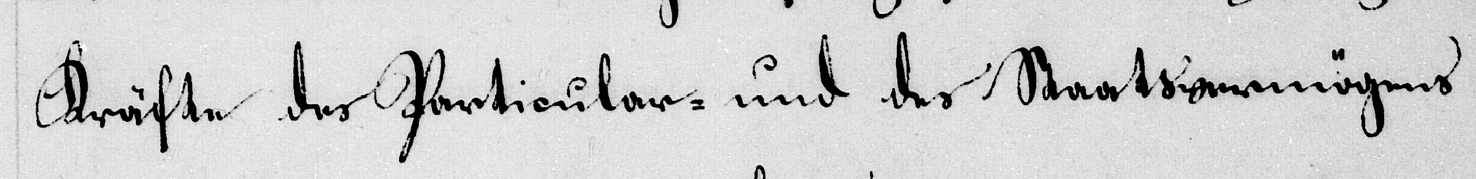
Kräfte des Particular- und des Staatsvermögens
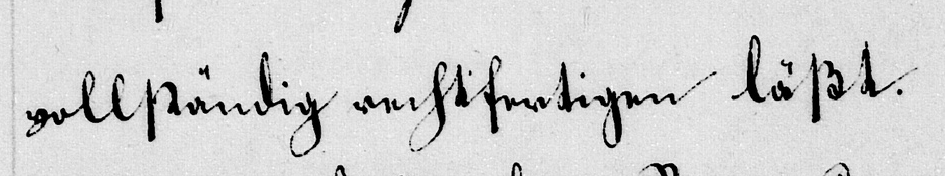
vollständig rechtfertigen läßt.
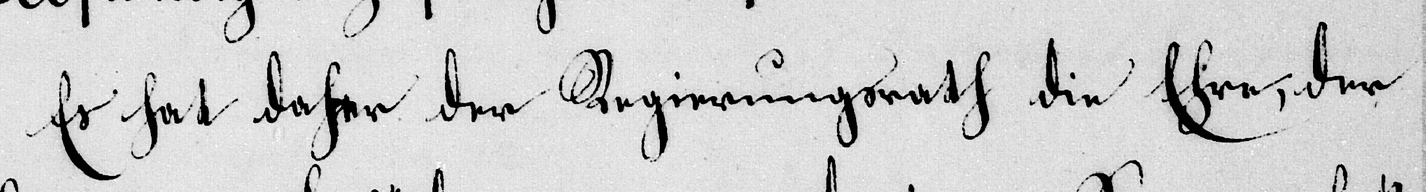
Es hat daher der Regierungsrath die Ehre, der
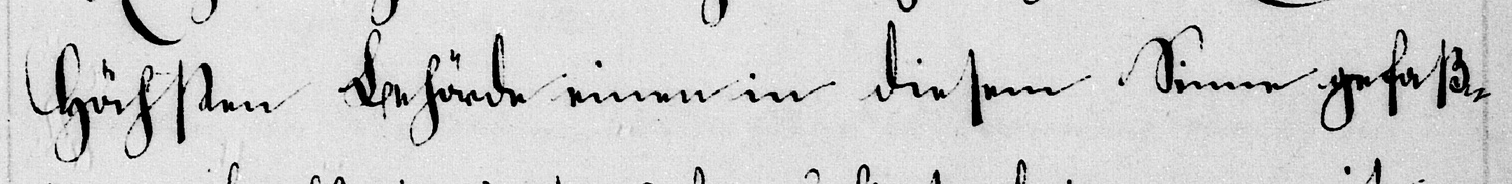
Höchsten Behörde einen in diesem Sinne gefaß¬
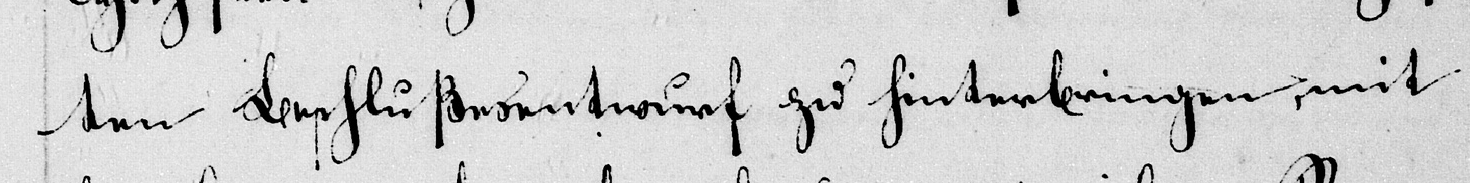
ten Beschlußesentwurf zu hinterbringen, mit
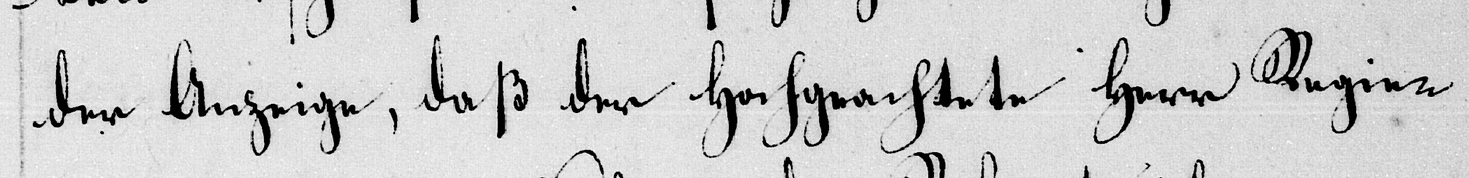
der Anzeige, daß der Hochgeachtete Herr Regie¬
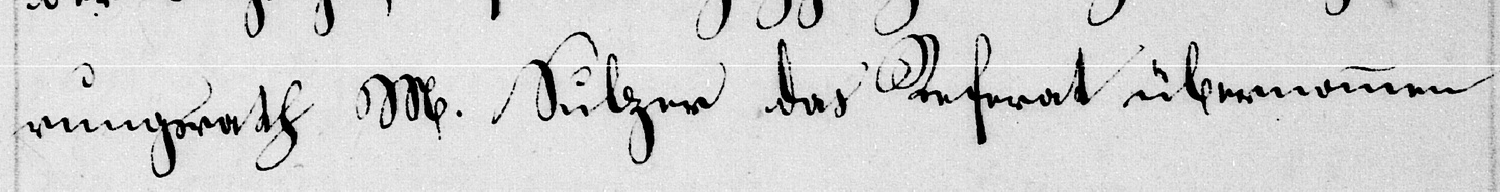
rungsrath M. Sulzer das Referat übernommen
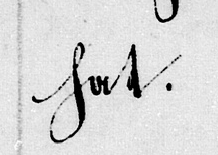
hat.
